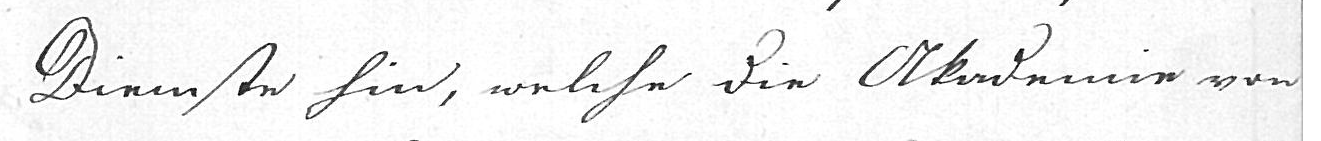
Dienste hin, welche die Akademie von
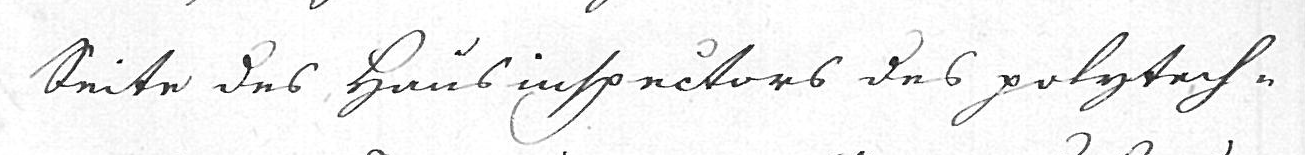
Seite des Hausinspectors des polytech-
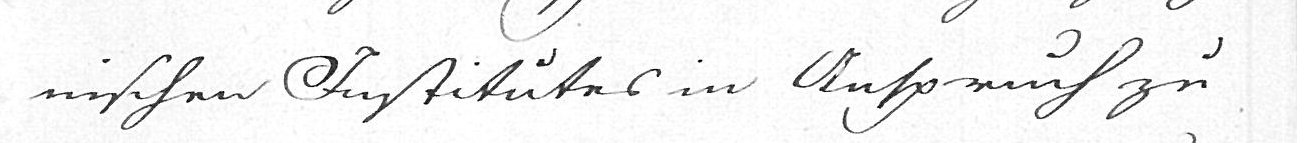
schen Institutes in Anspruch zu
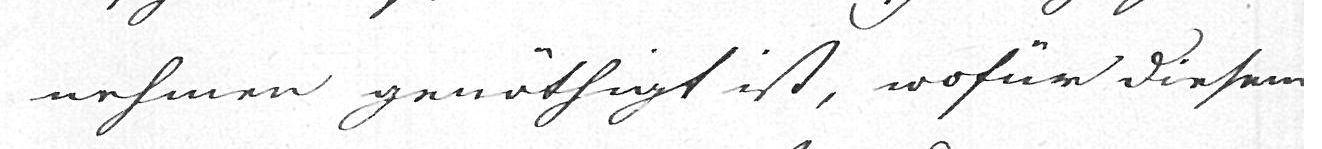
nehmen genöthigt ist, wofür diesem
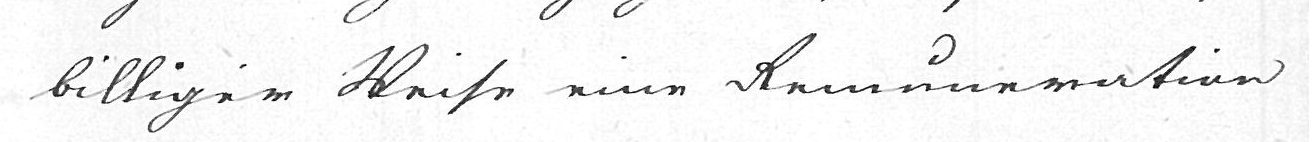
billiger Weise eine Remuneration
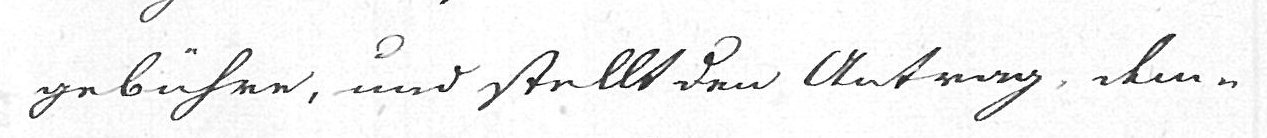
gebühre, und stellt der Antrag, dem-
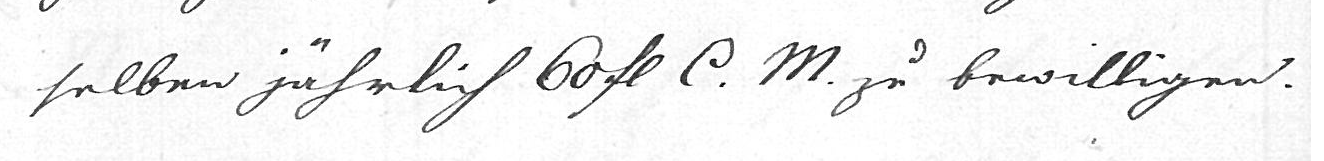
selben jährlich 60 fl. C.M. zu bewilligen.
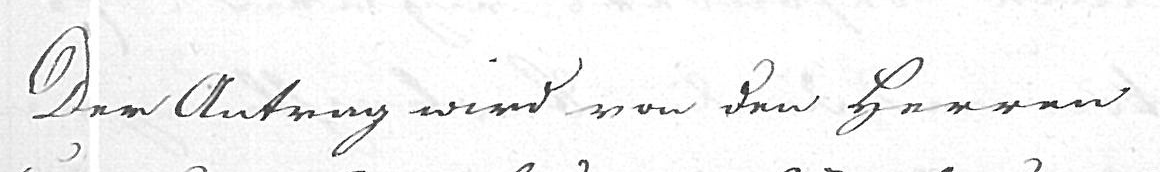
Der Antrag wird von den Herren
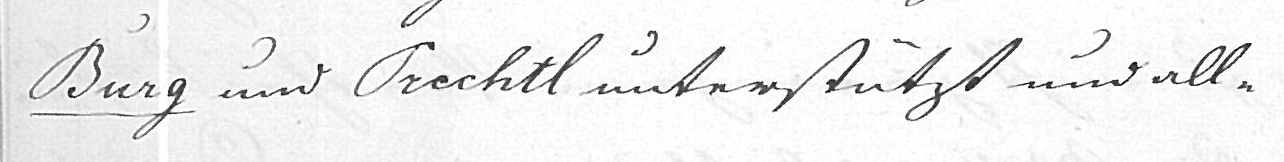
Burg und Prechtl unterstützt und all-
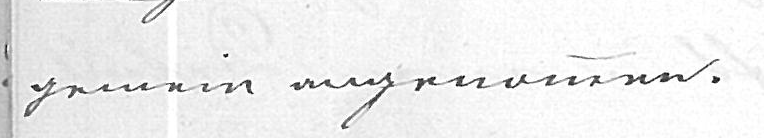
gemein angenommen.
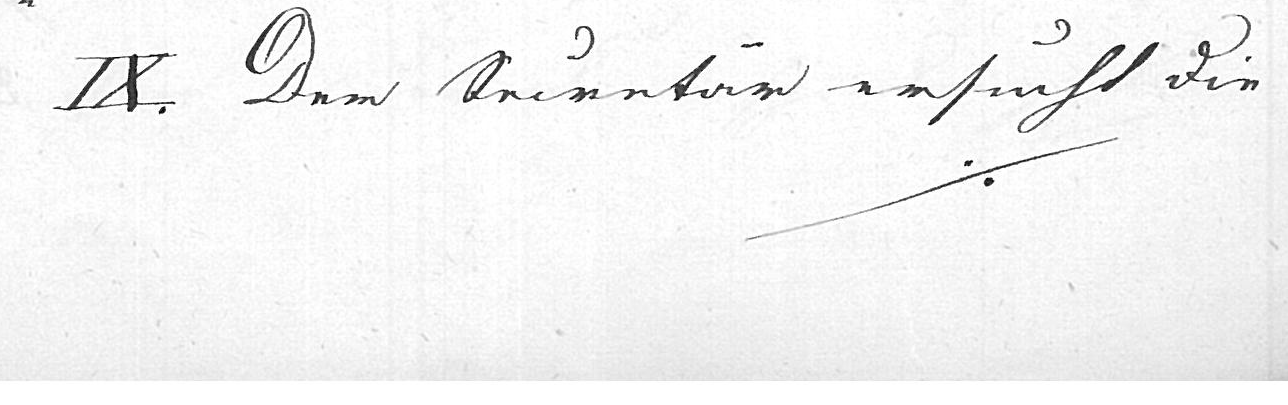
IX. Der Secretär ersucht die
